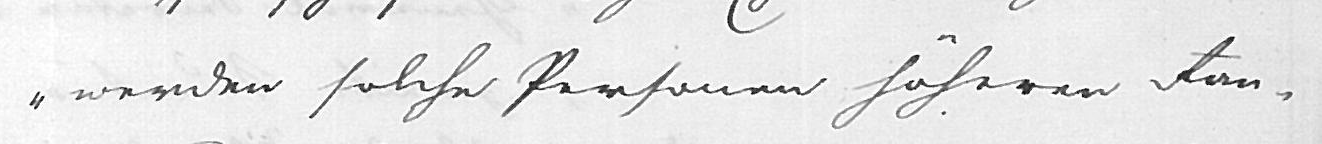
"werden solche Personen höhren Rang-
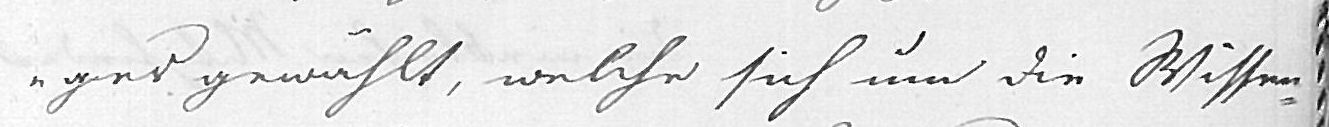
"ges gewählt, welche sich um die Wissen-
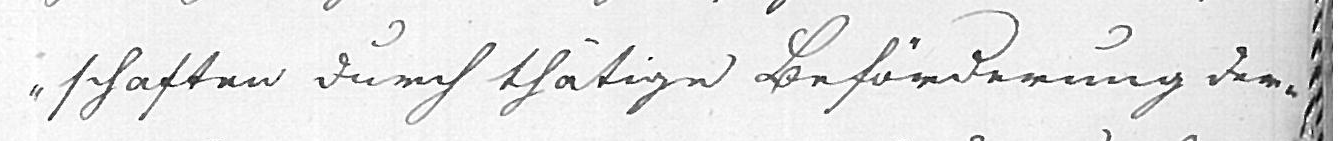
"schaften durch thätige Beförderung der-
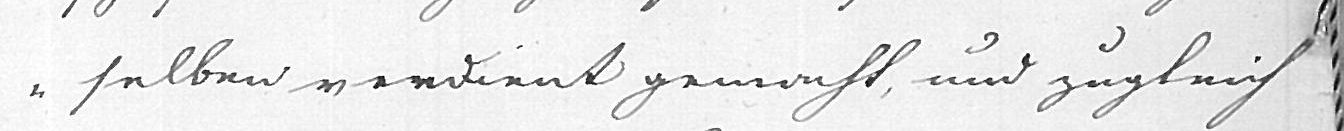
"selben verdient gemacht, und zugleich
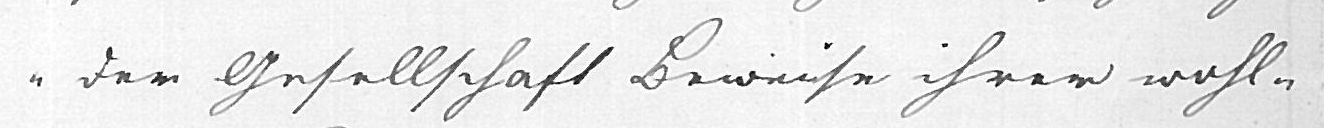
"der Gesellschaft Beweise ihrer wohl-
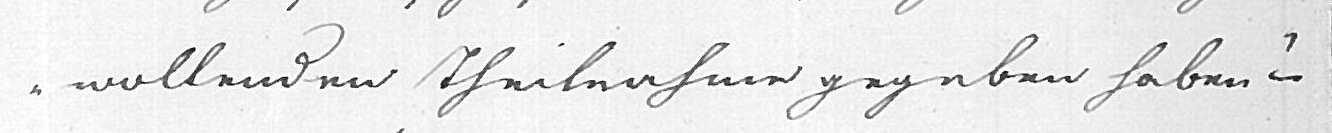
wollenden Theilnahme gegeben haben."
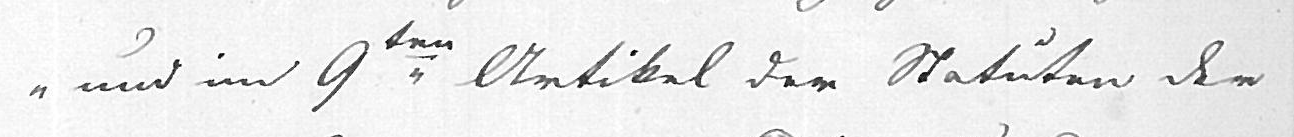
"und im 9ten Artikel der Statuen der
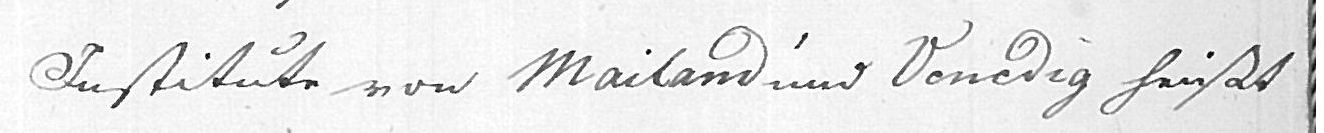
Institute von Mailand und Venedig heißt
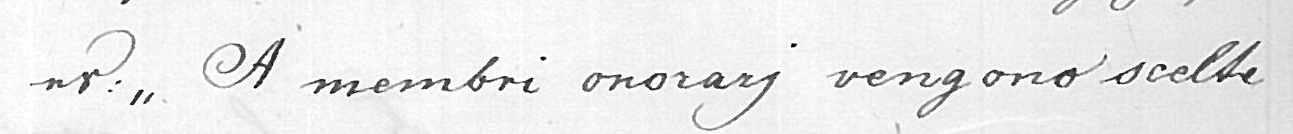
es: "A membri onorarj vengono scelte
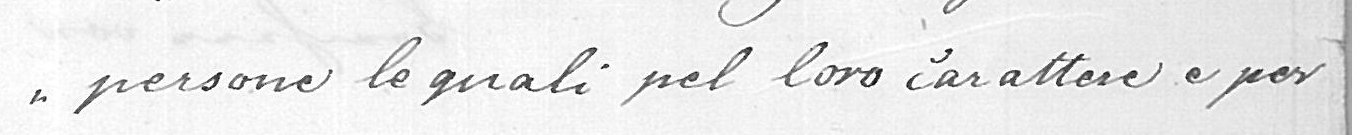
"persone le quali pel loro carattere e per-
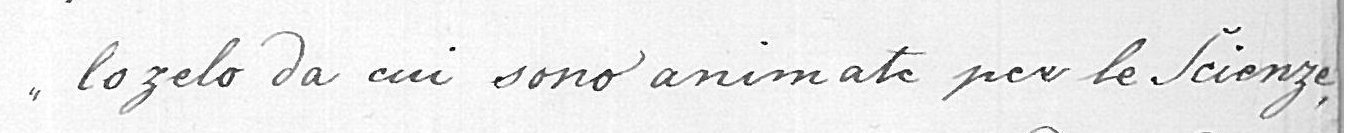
"lozelo da cui sono animate per le Scienza,
